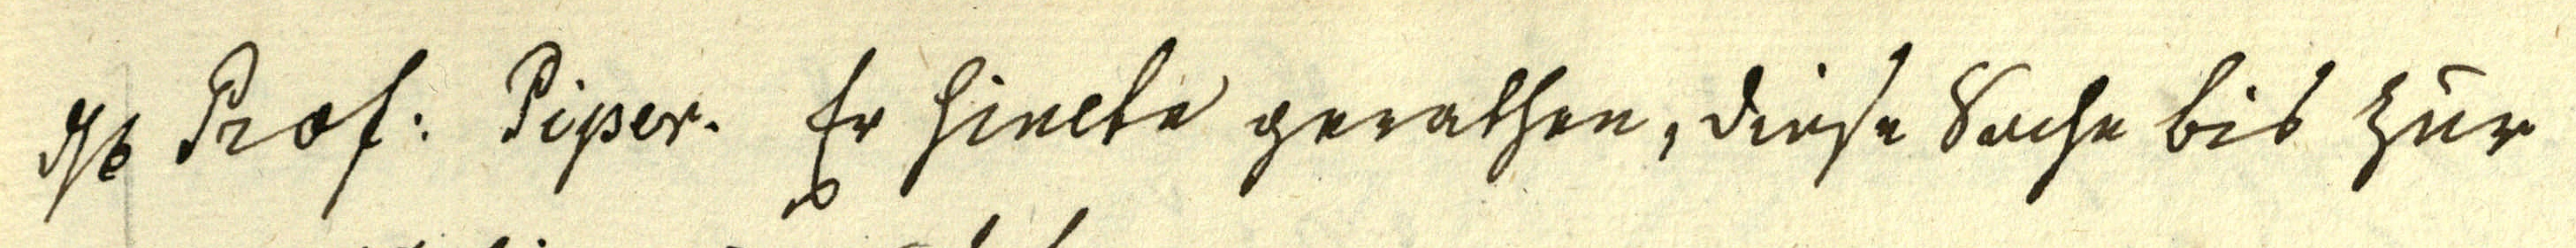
dh Prof. Piper. Er hielte gerathen, diese Sache bis zur
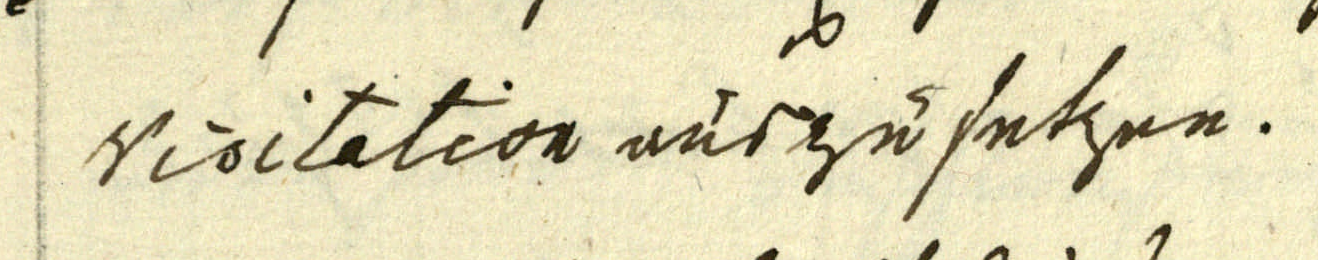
Visitation auszusetzen.
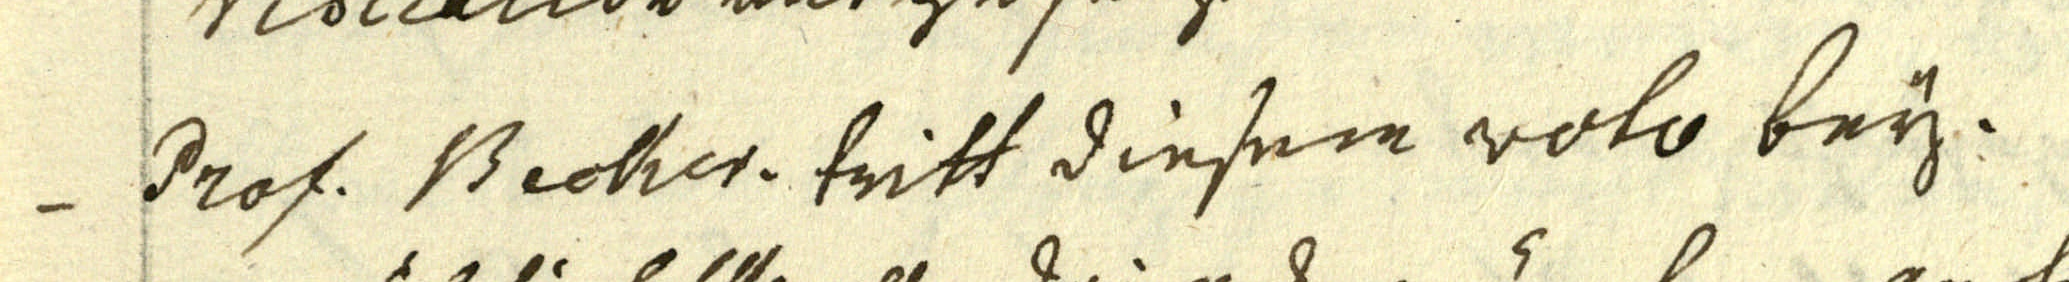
Prof. Becker. tritt diesem voto beÿ.
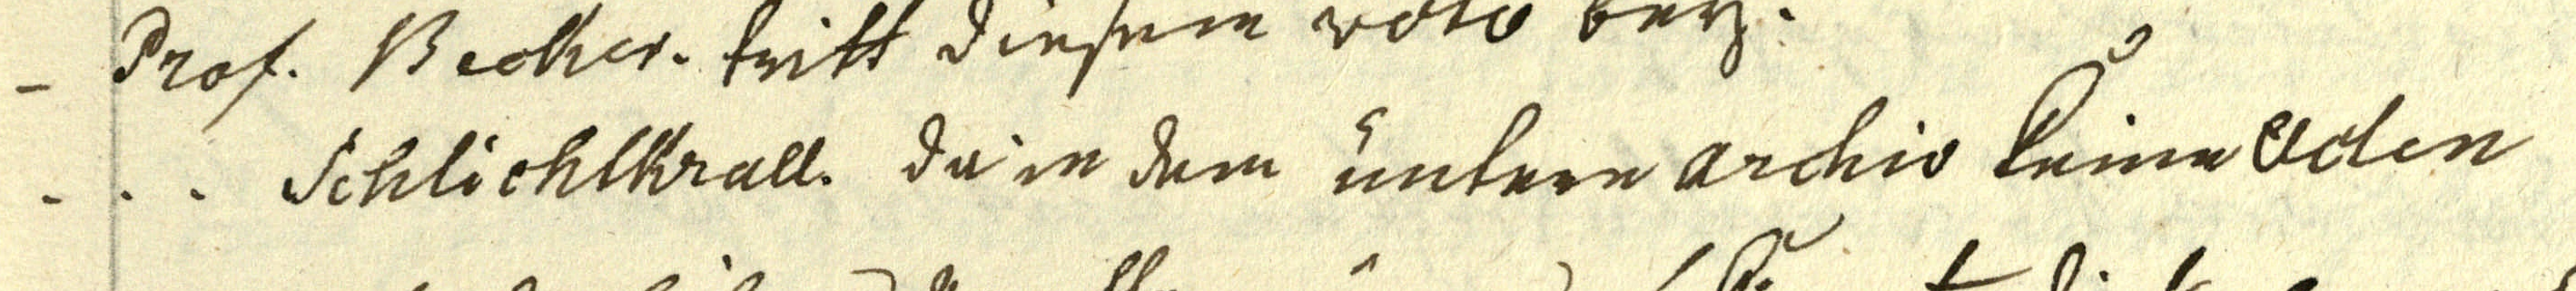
Schlichtkrull. Da in dem untern Archiv keine Acten
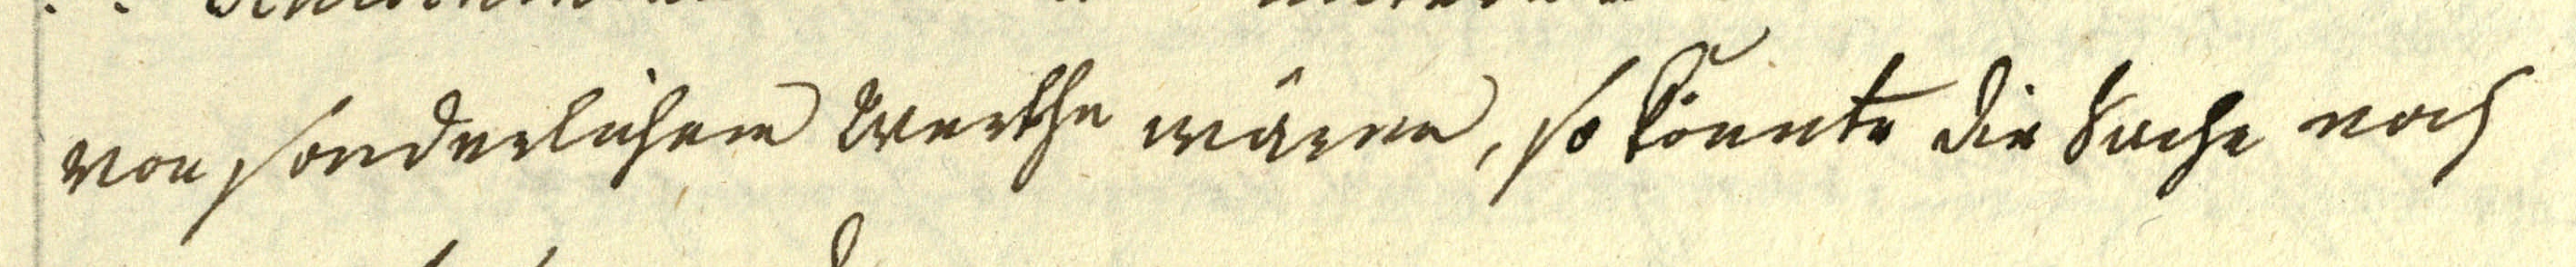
von sonderlichem Werthe wären, so könnte die Sache noch
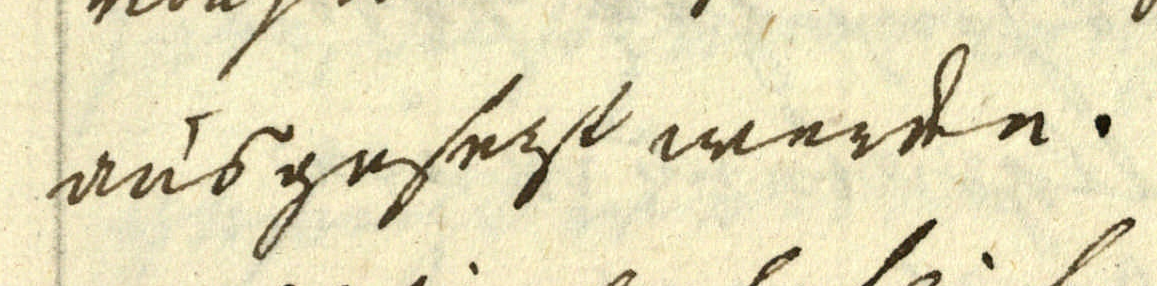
ausgesezt werden.
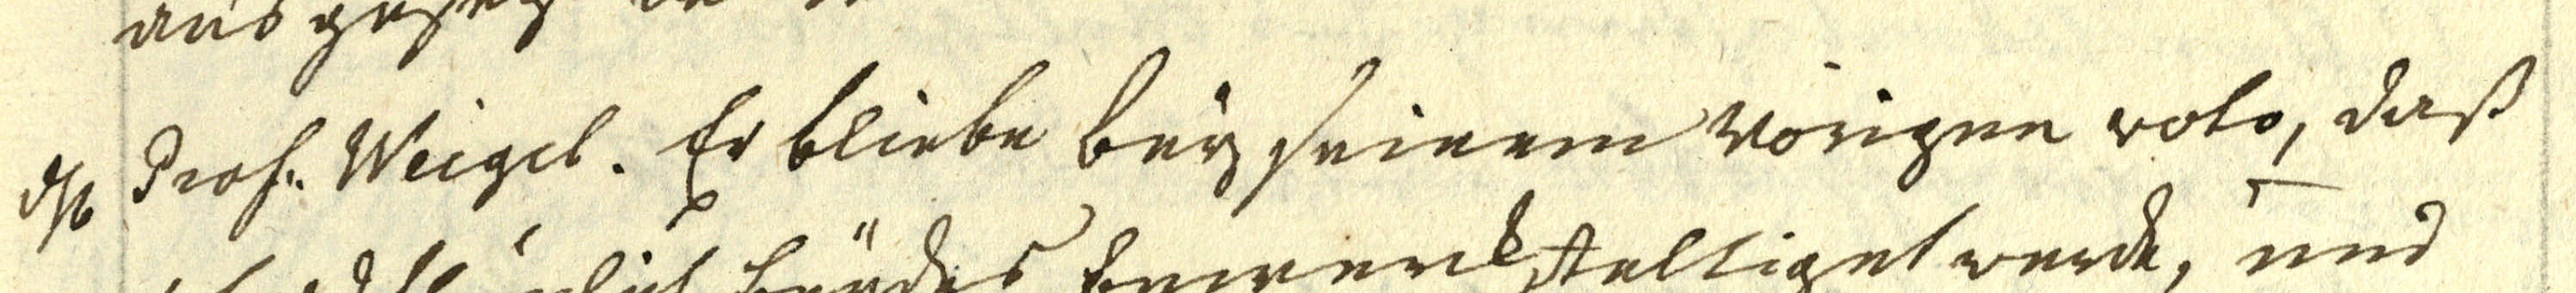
dh Prof. Weigel. Er bliebe beÿ seinem vorigen voto, daß
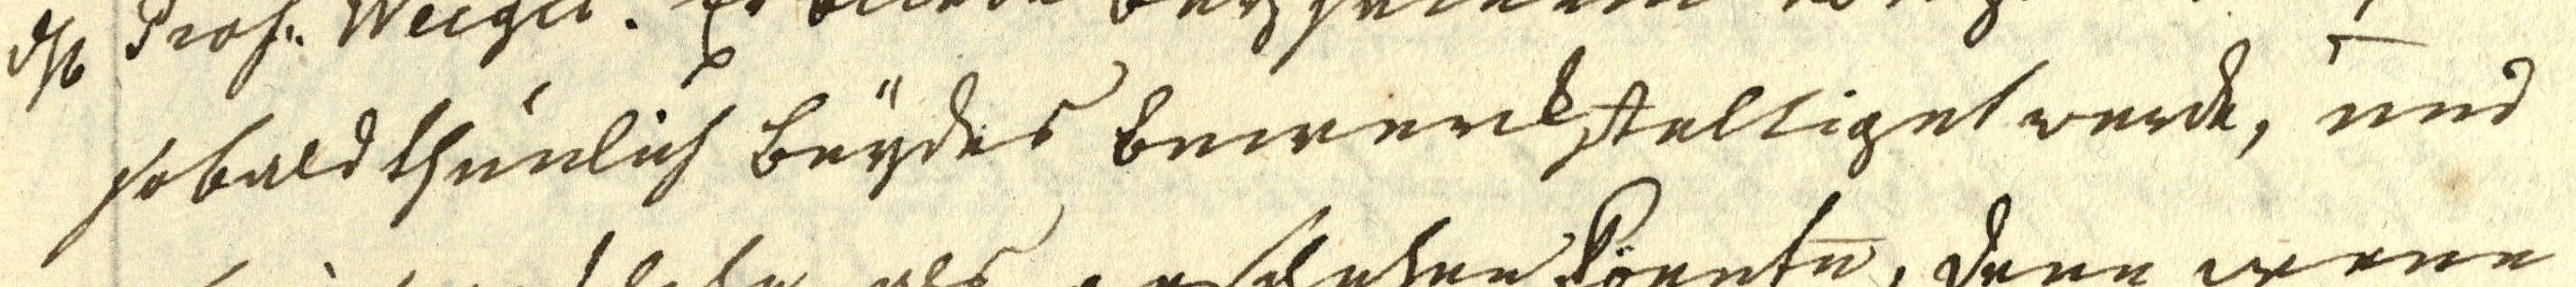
sobald thunlich beÿdes bewerckstelliget werde, und
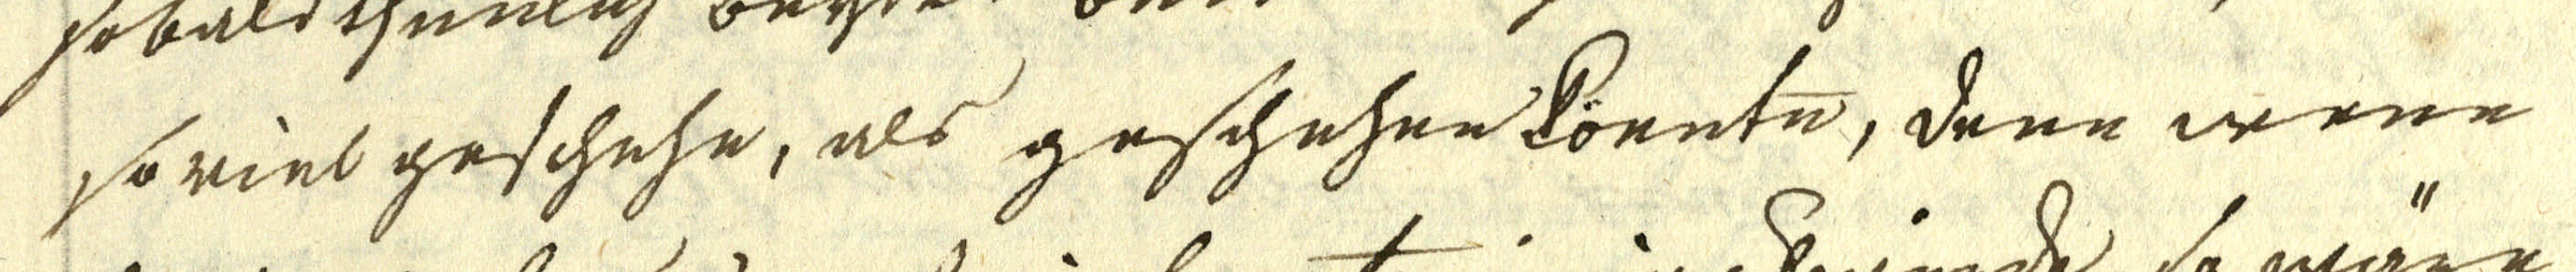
so viel geschehe, als geschehen könnte, denn wenn
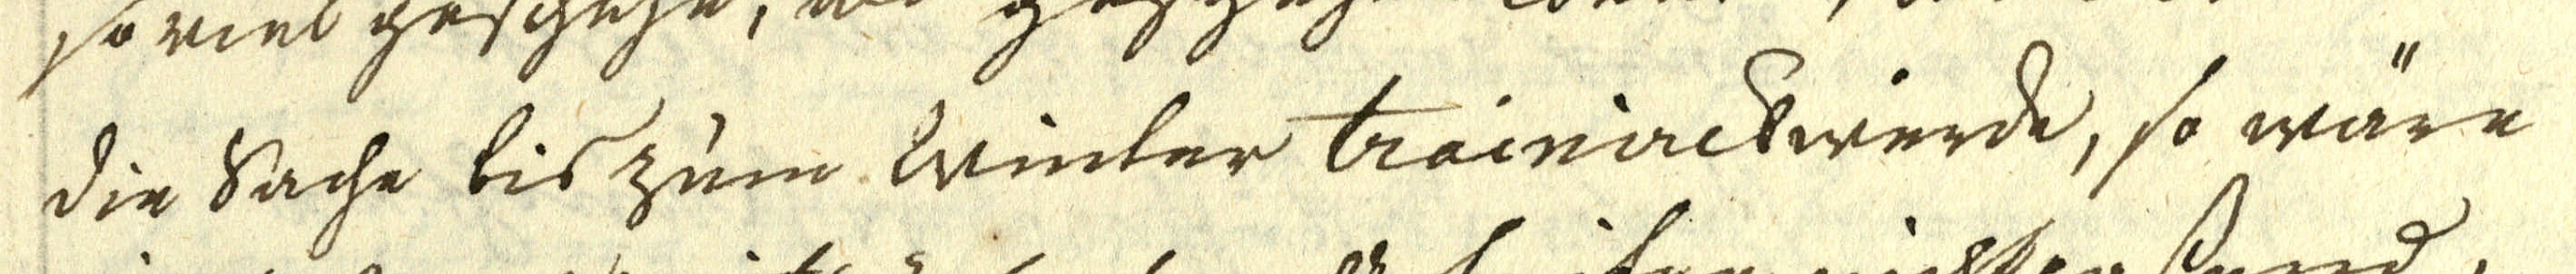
die Sache bis zum Winter trainiret würde, so wäre
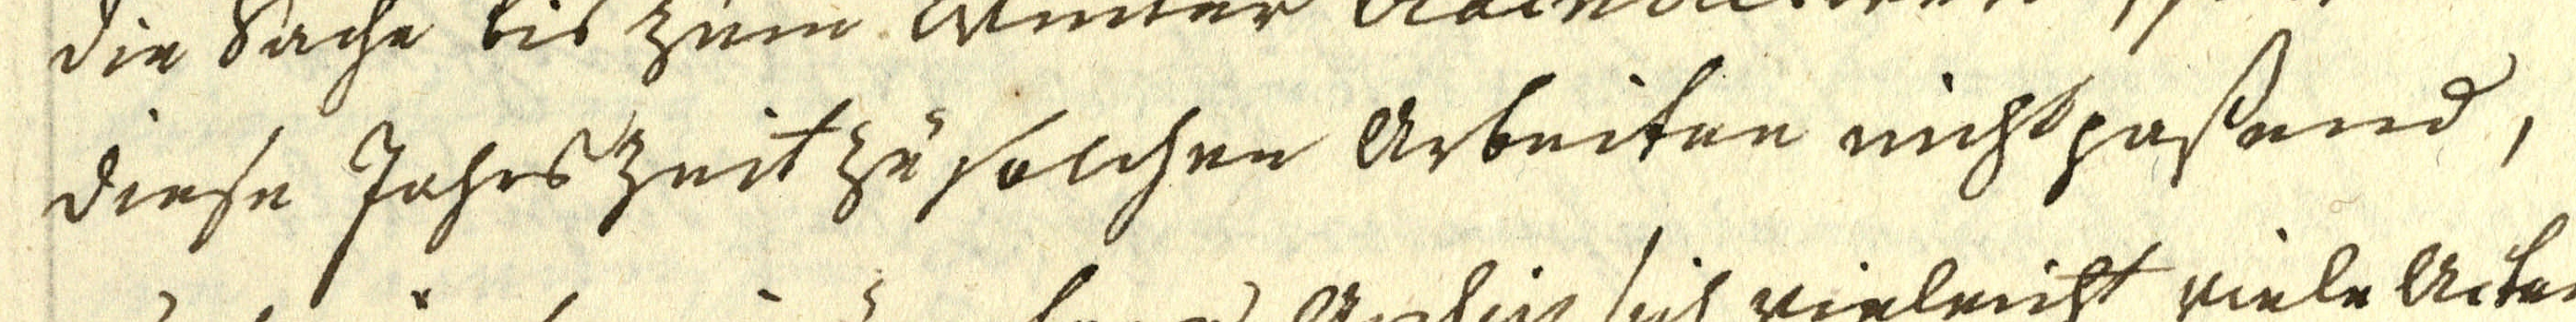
diese Jahres Zeit zu solchen Arbeiten nicht passend,
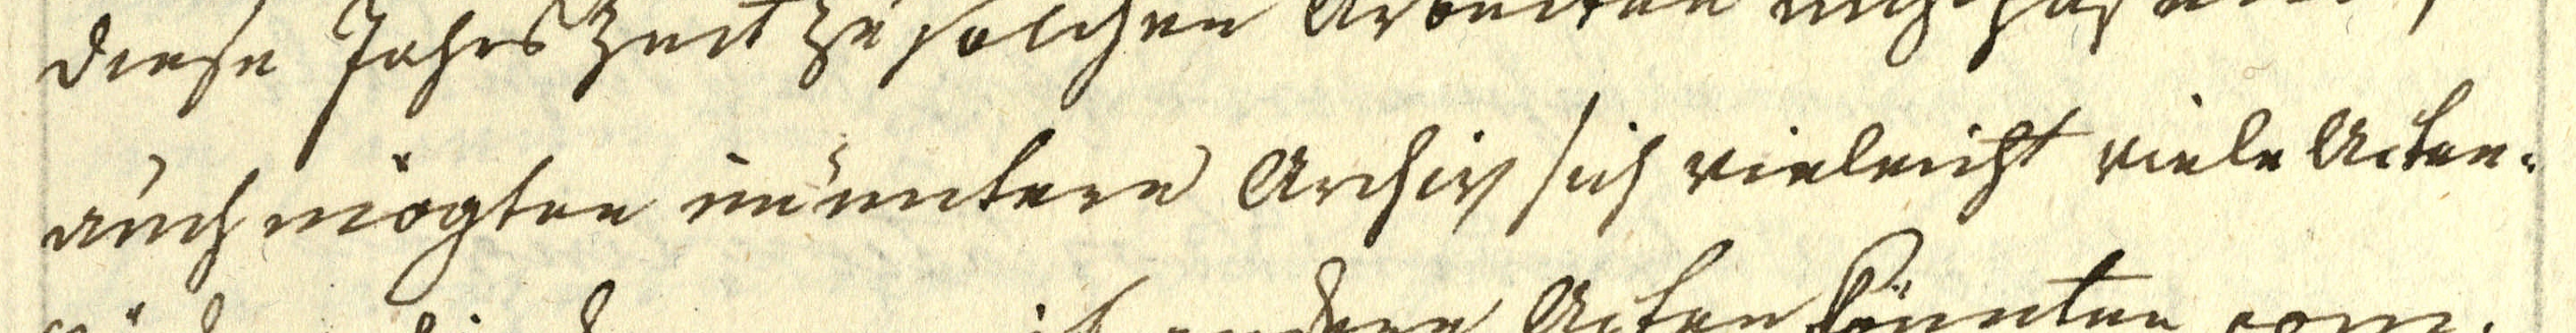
auch mögten im untern Archiv sich vieleicht viele Acten¬
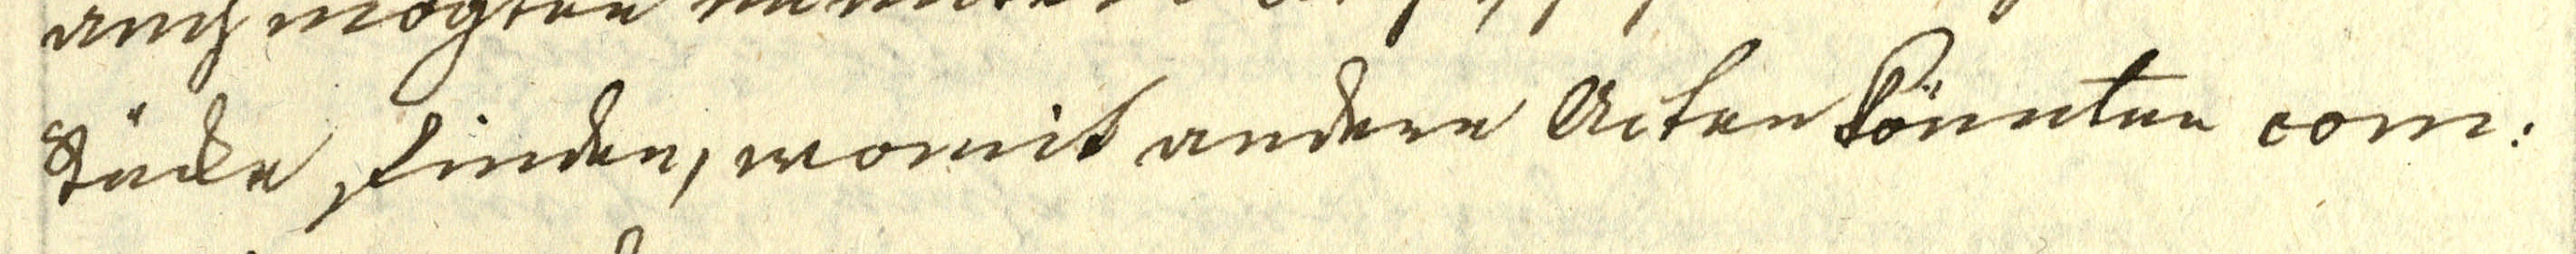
Stücke finden, womit andere Acten könnten com¬
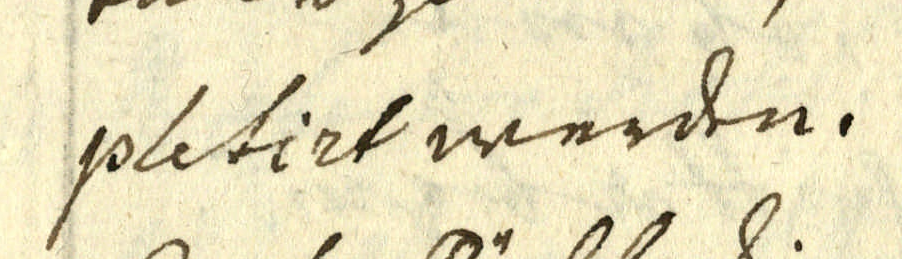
pletirt werden.
